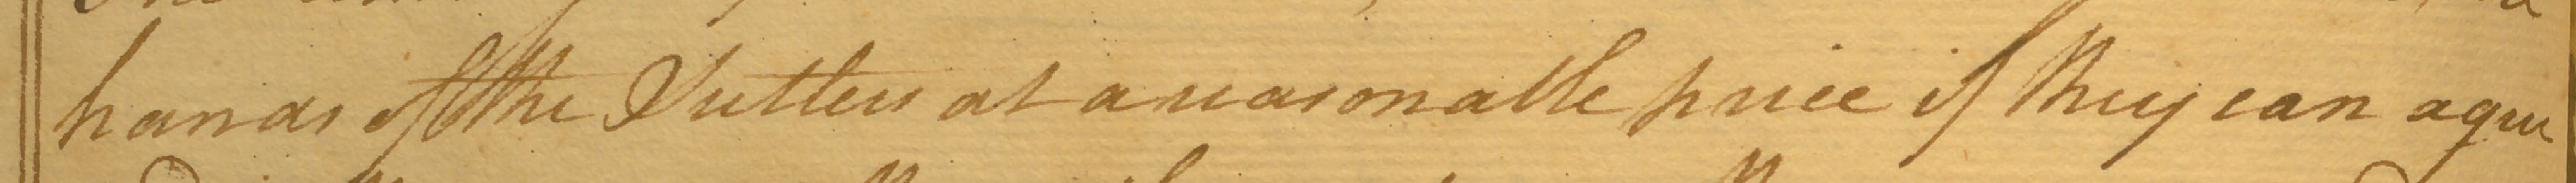hands of the Sutlers at a reasonable price if they can agree
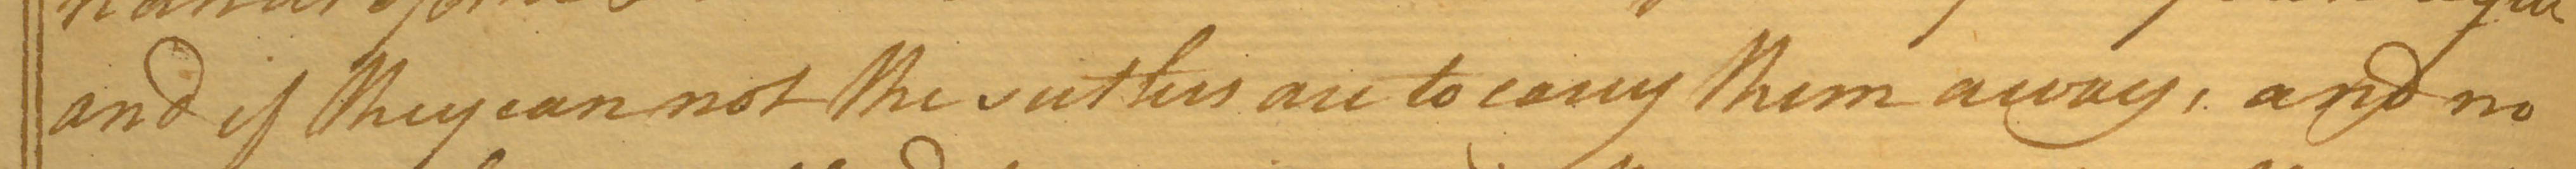and if they can not the sutlers are to carry them away, and no
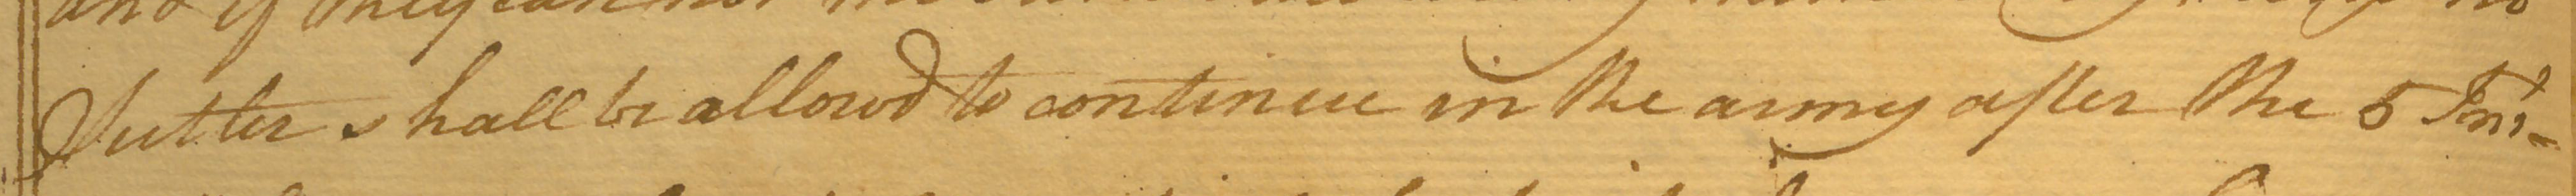Sutler shall be allowd to continue in the army after the 5 Ins^t.
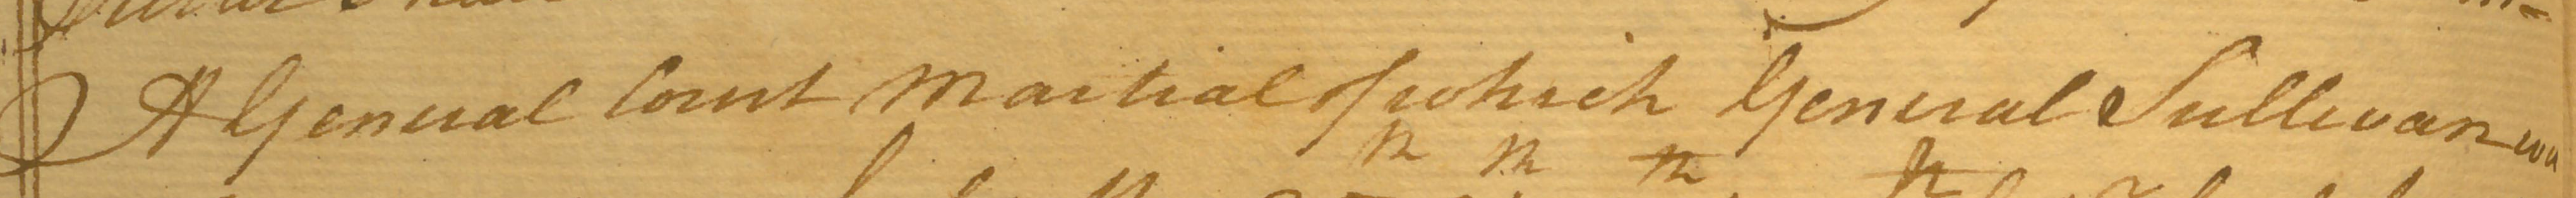A General Court martial of which General Sullivan wa
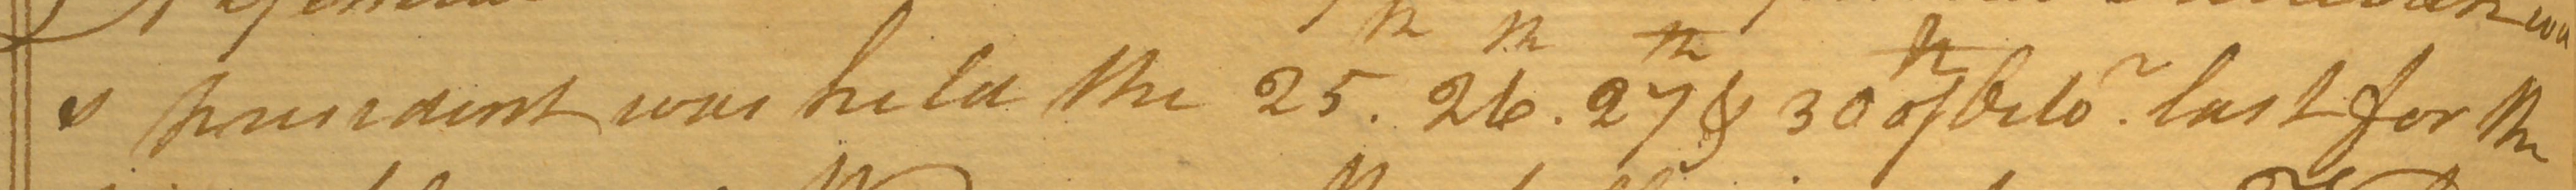s president was held the 25^th. 26^th. 27^th. & 30^th. of Octo^r. last for the
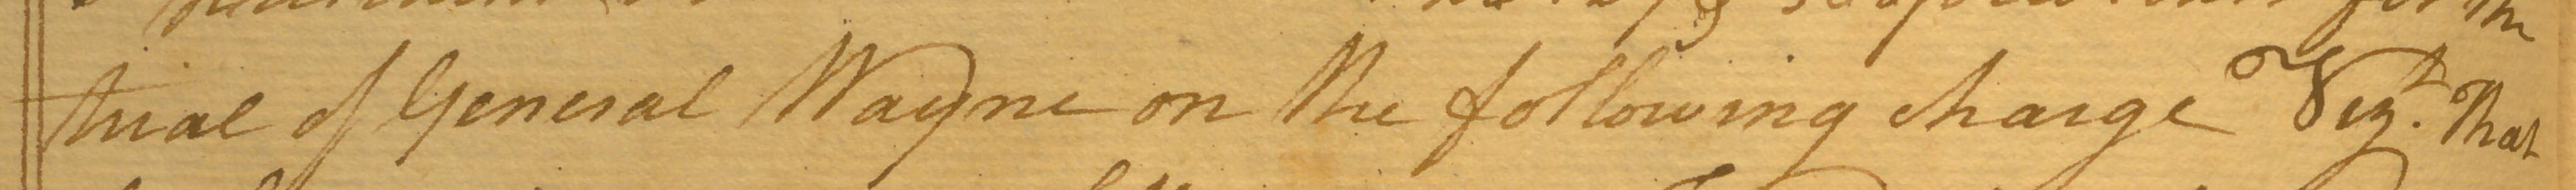trial of General Wayne on the following charge Viz^t. That
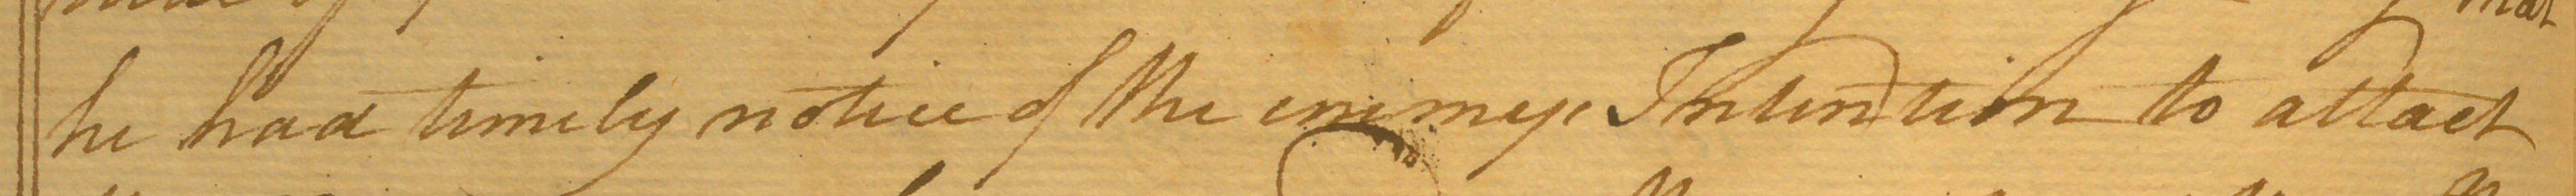he had timely notice of the enemys Intention to attack
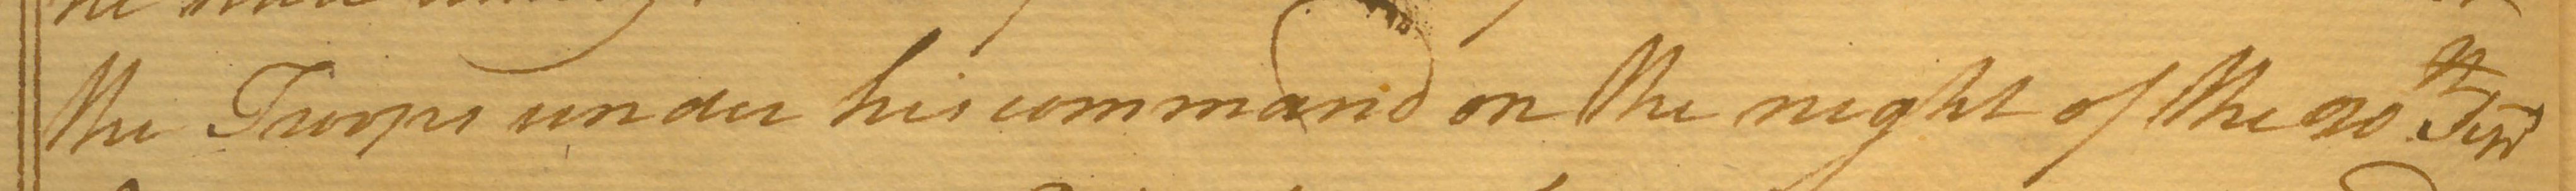the Troops under his command on the night of the 20^th. Ins^t
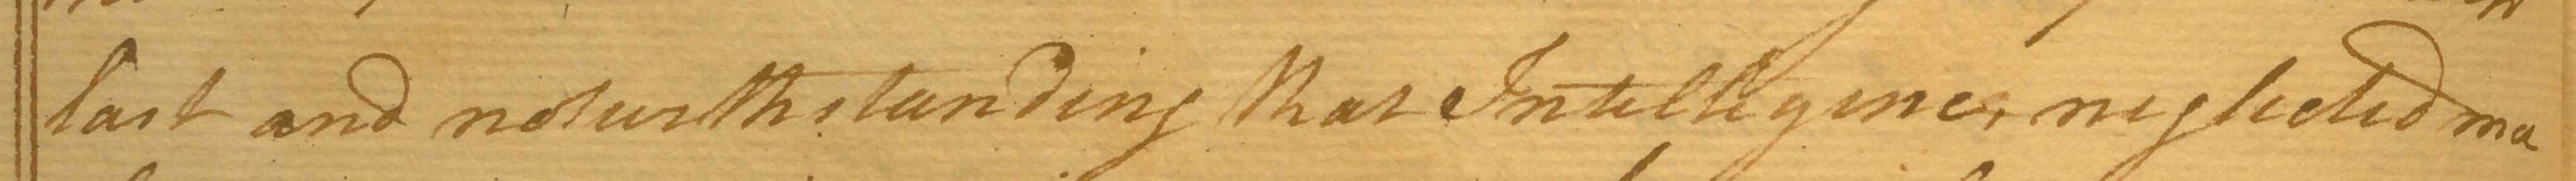last and notwithstanding that Intelligence neglected ma
